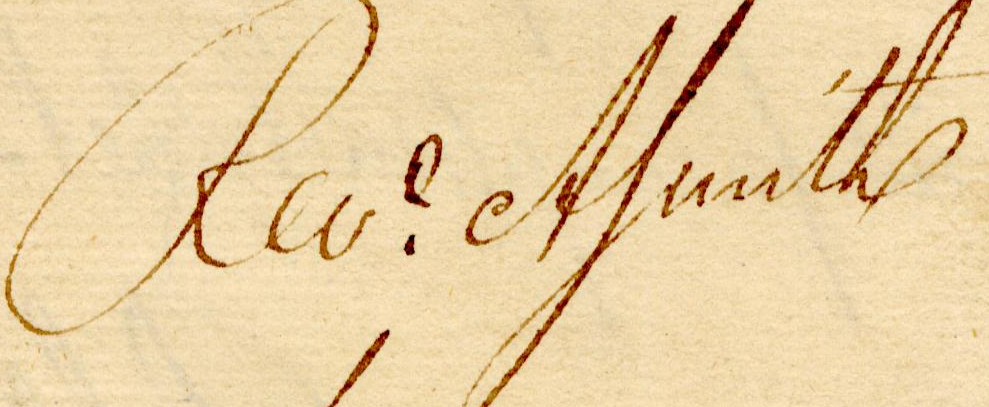Rev^d. Asmith
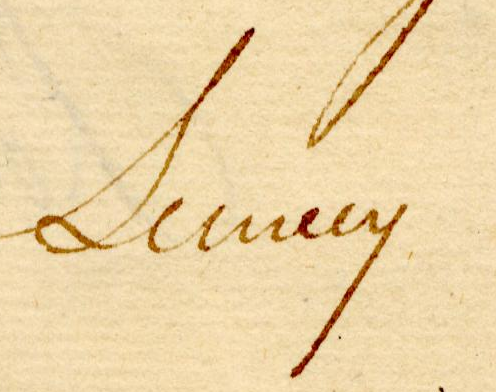Survey
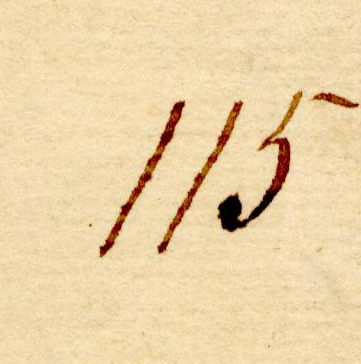115
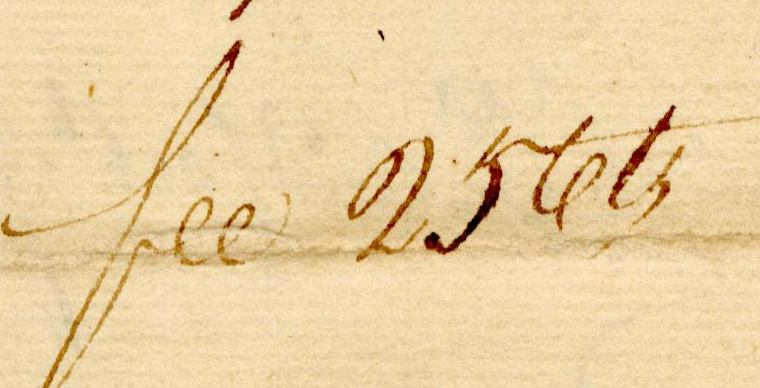fee 256^ts
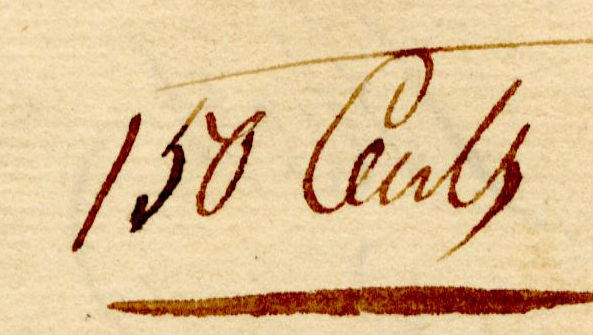150 Cents
